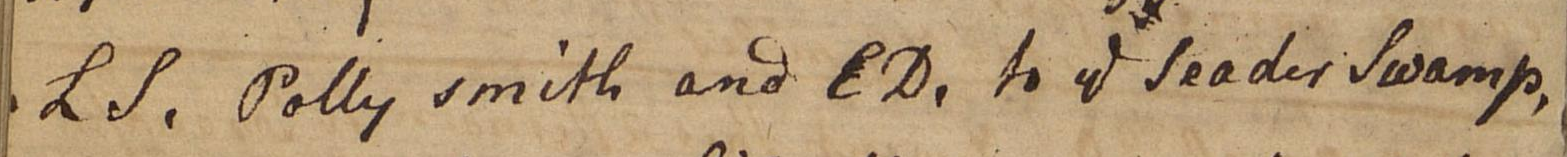LS. Polly smith and ED. to y^e Seader Swamp,
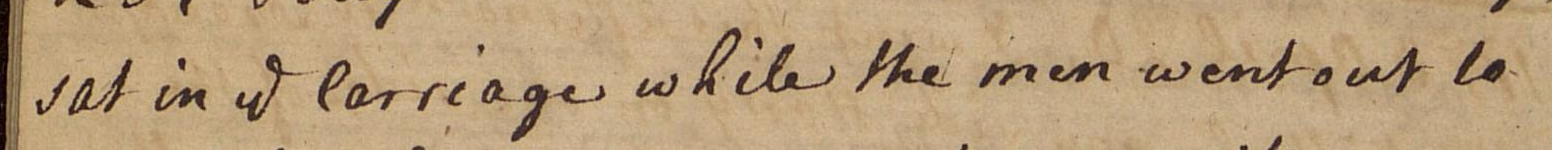sat in y^e Carriage while the men went out to
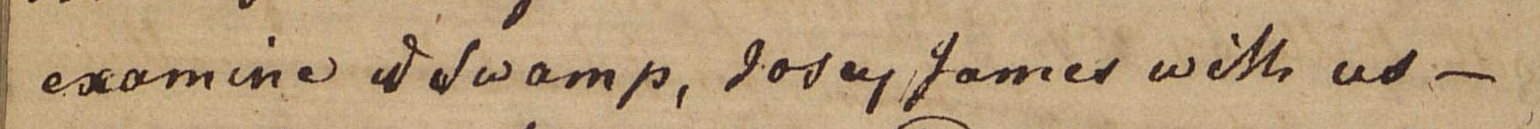examine y^e Swamp, Josey James with us-
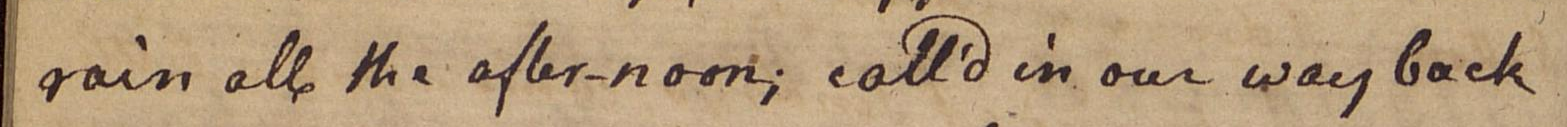rain all the after-noon; call'd in our way back
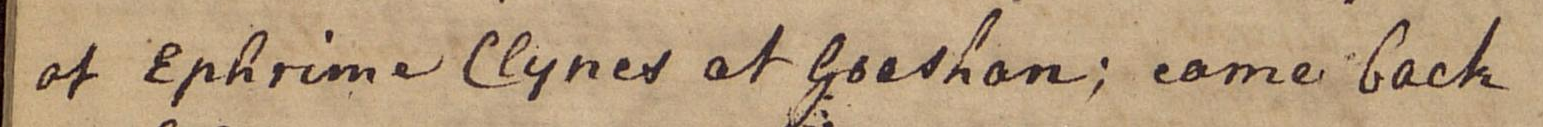at Ephrime Clynes at Goeshan; came back
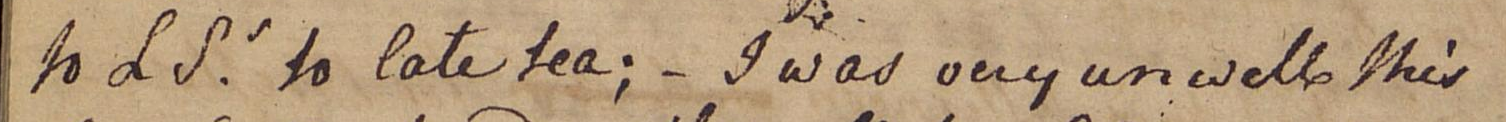to LS^s. to late tea;- I was very unwell this
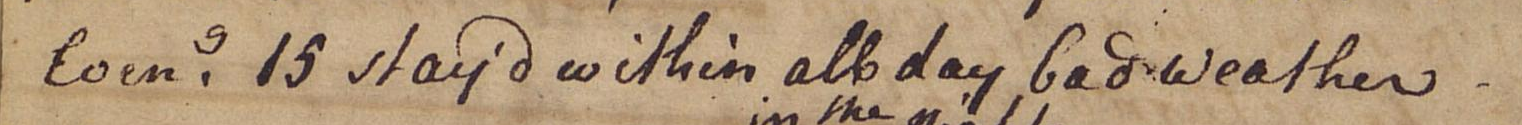Even^g. 15 stay'd within all day bad Weather
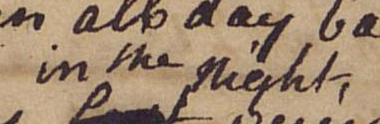in the night,
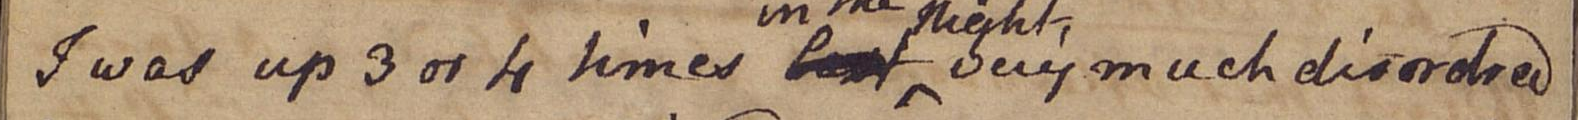I was up 3 or 4 times [last] ^ very much disordred
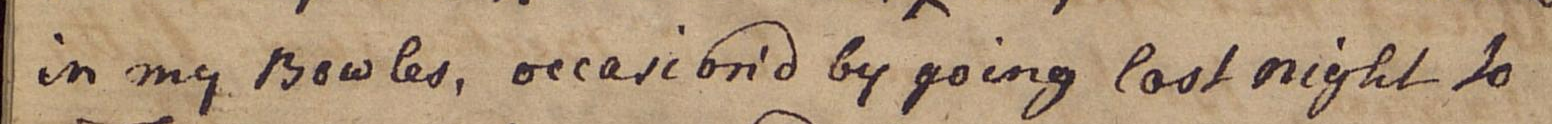in my Bowles, occasion'd by going last night to
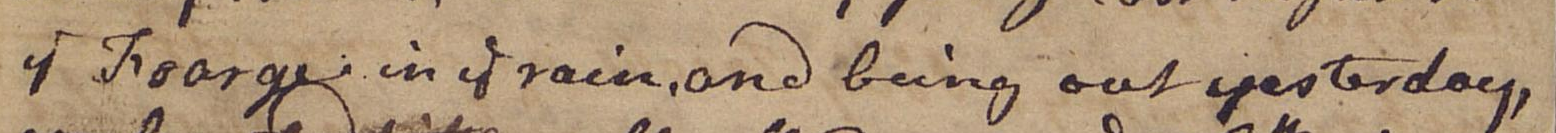y^e Foarge in y^e rain, and being out yesterday,
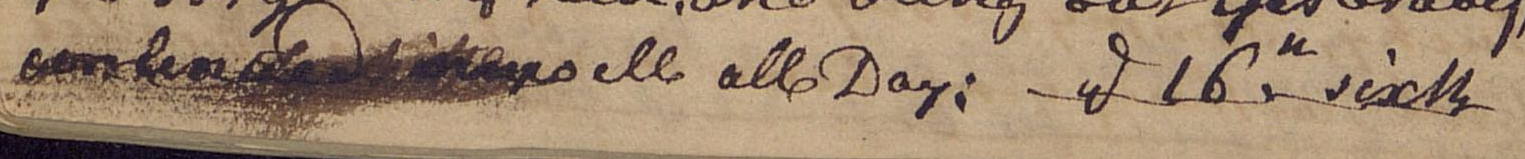[______________] all all Day: y^e 16^th. sixth
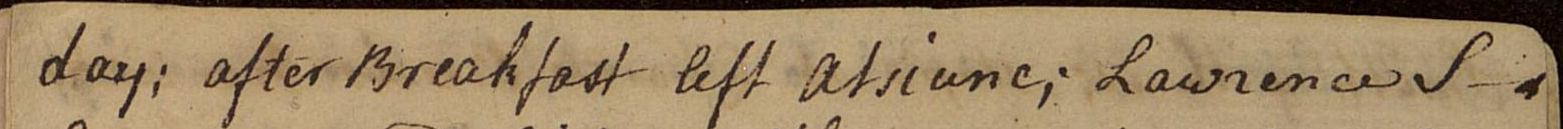day; after Breakfast left Atsiunc; Lawrence S-
